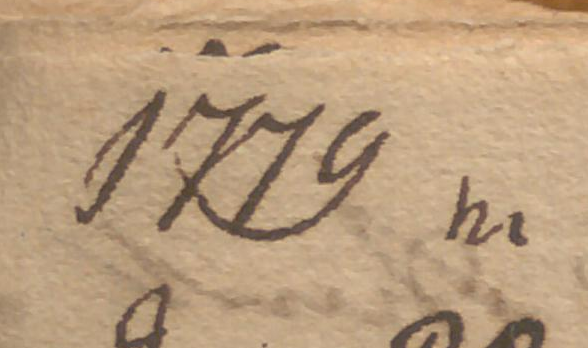1779
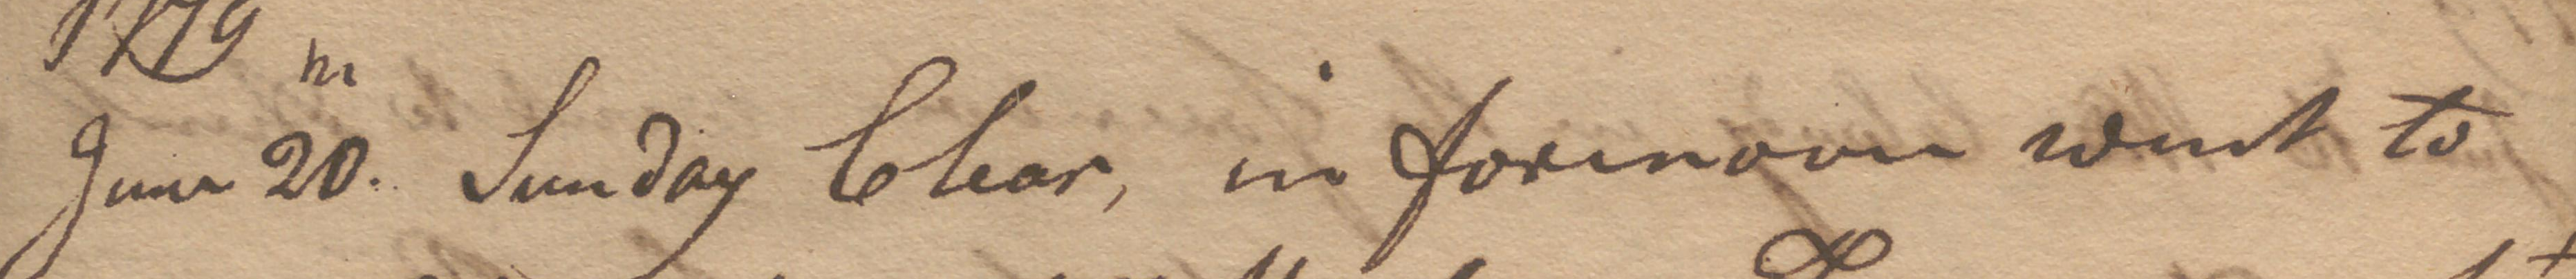June 20^th. Sunday Clear, in forenoon went to
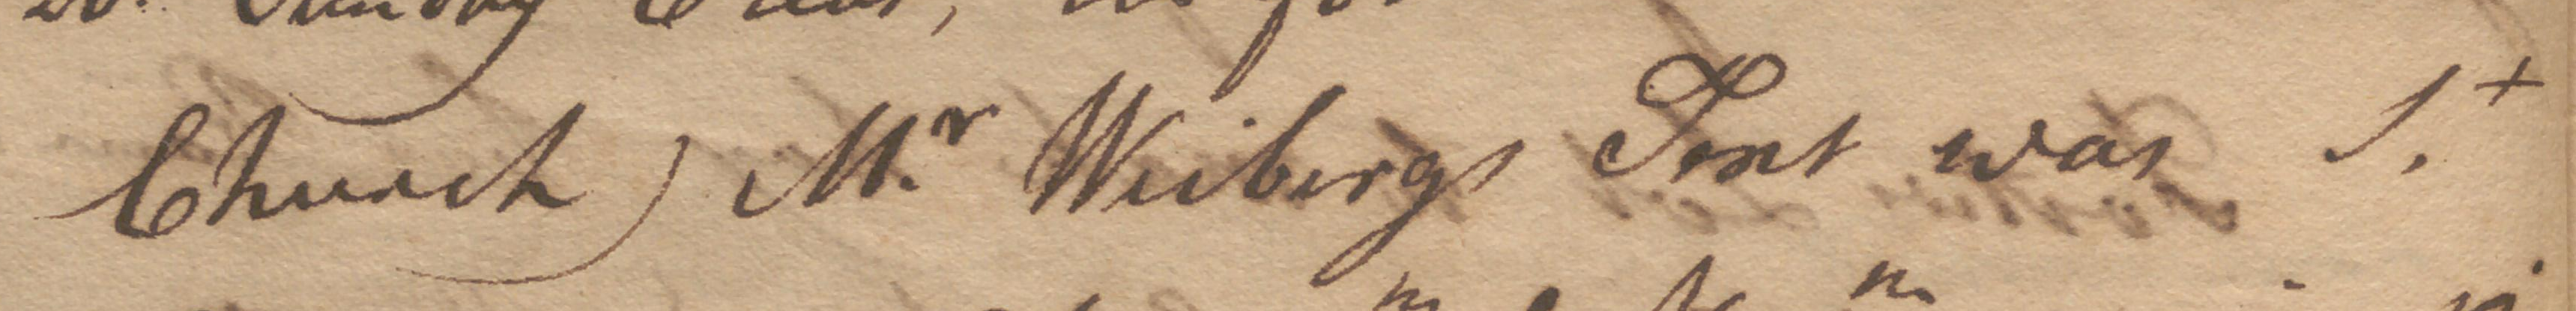Church) M^r. Weibergs Text was S^t.
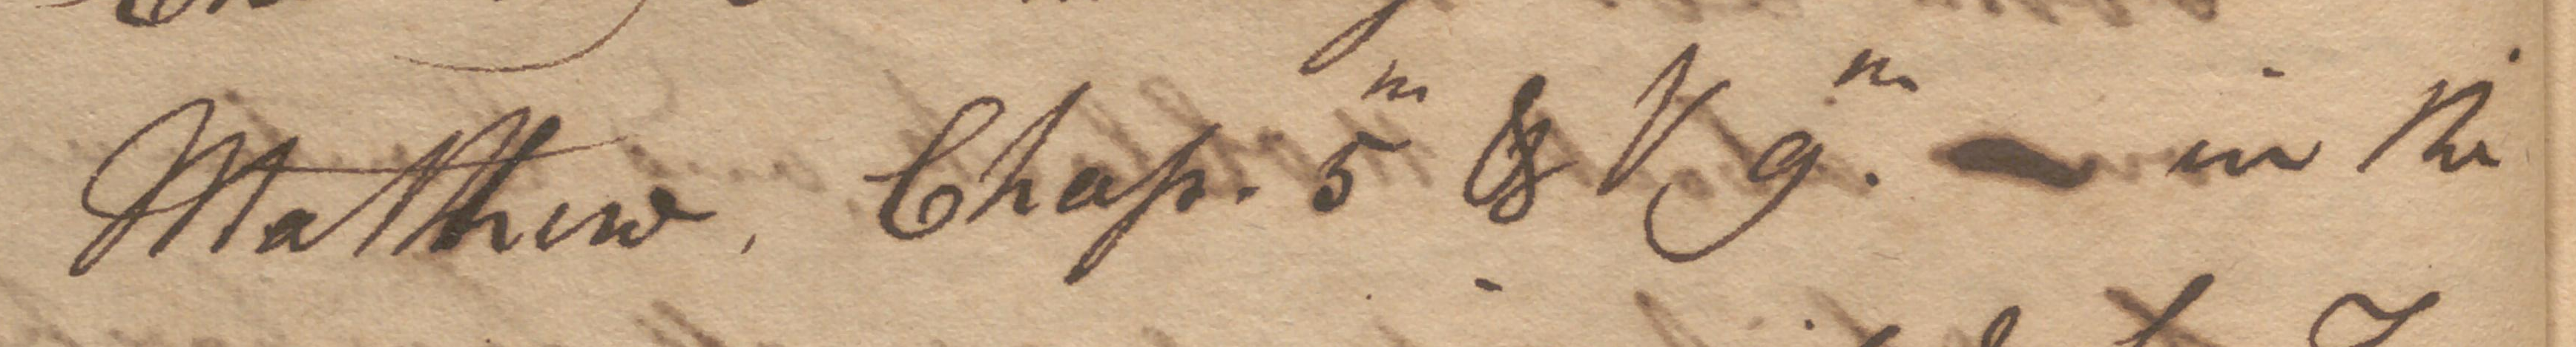Matthew, Chap. 5^th & V 9^th. in the
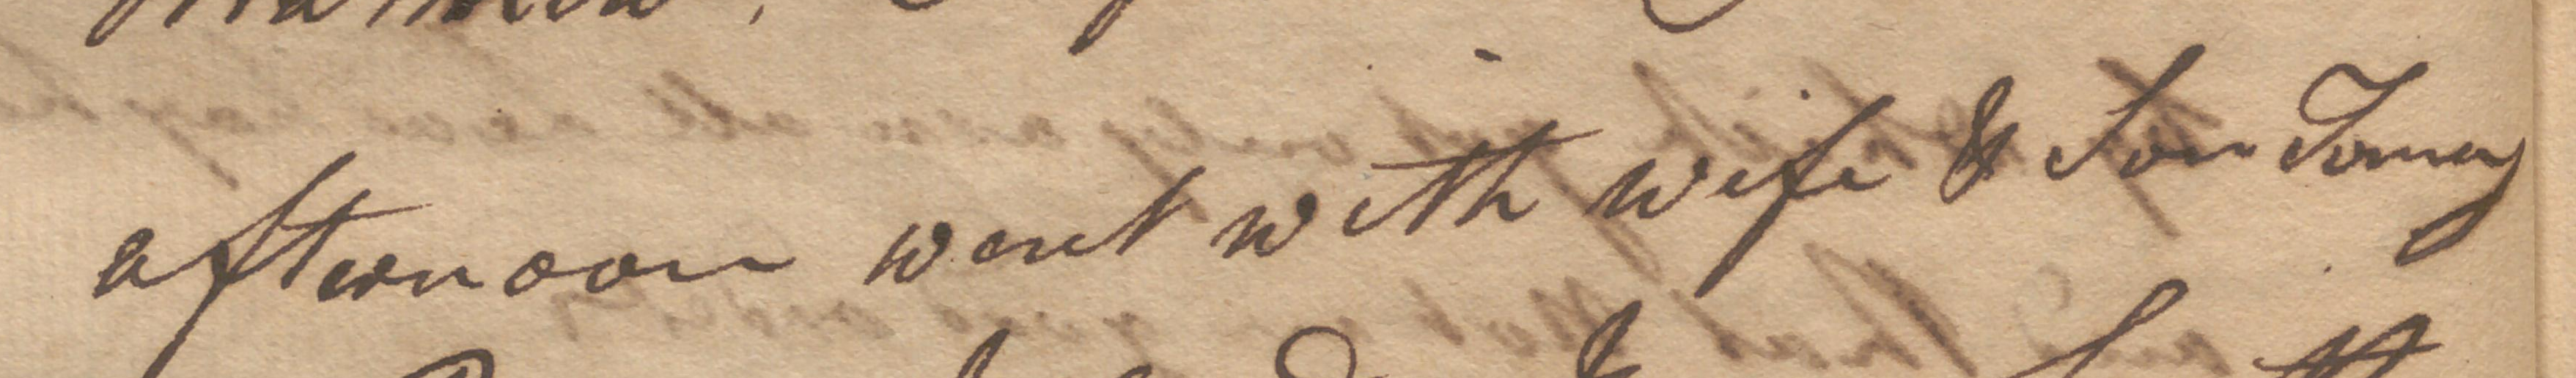afternoon went with wife & son Tomey
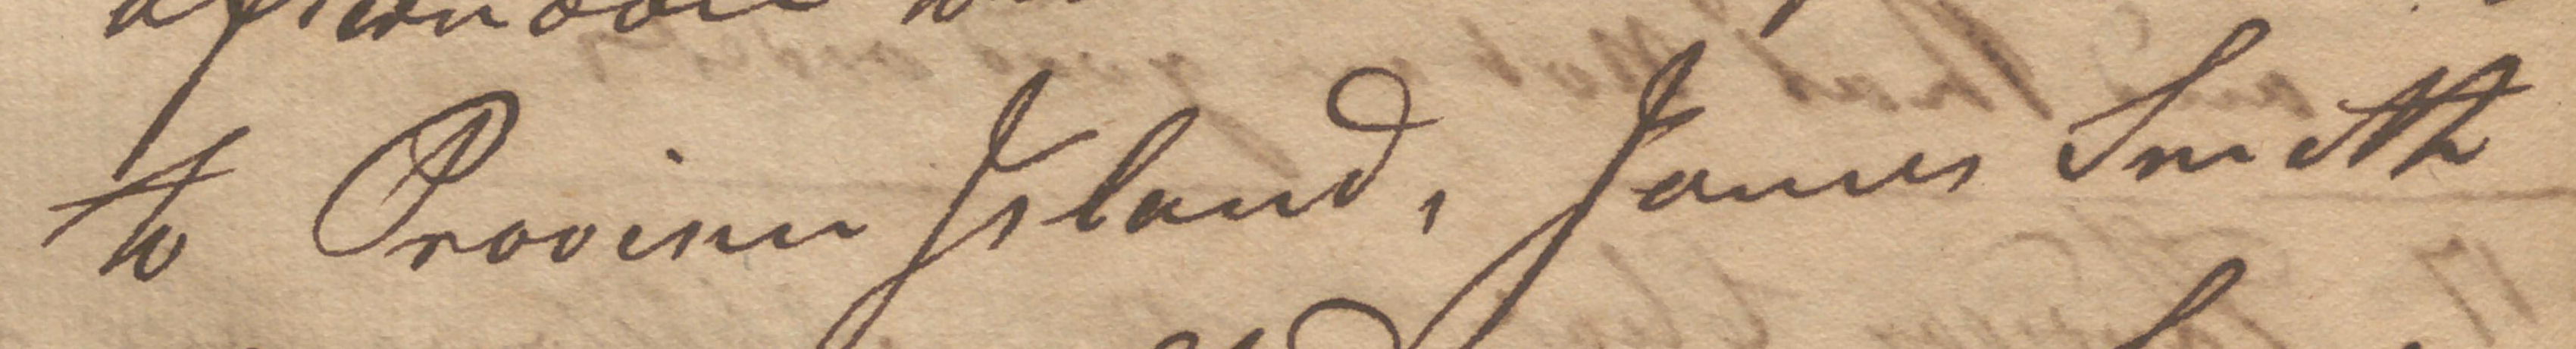to Province Island, James Smith
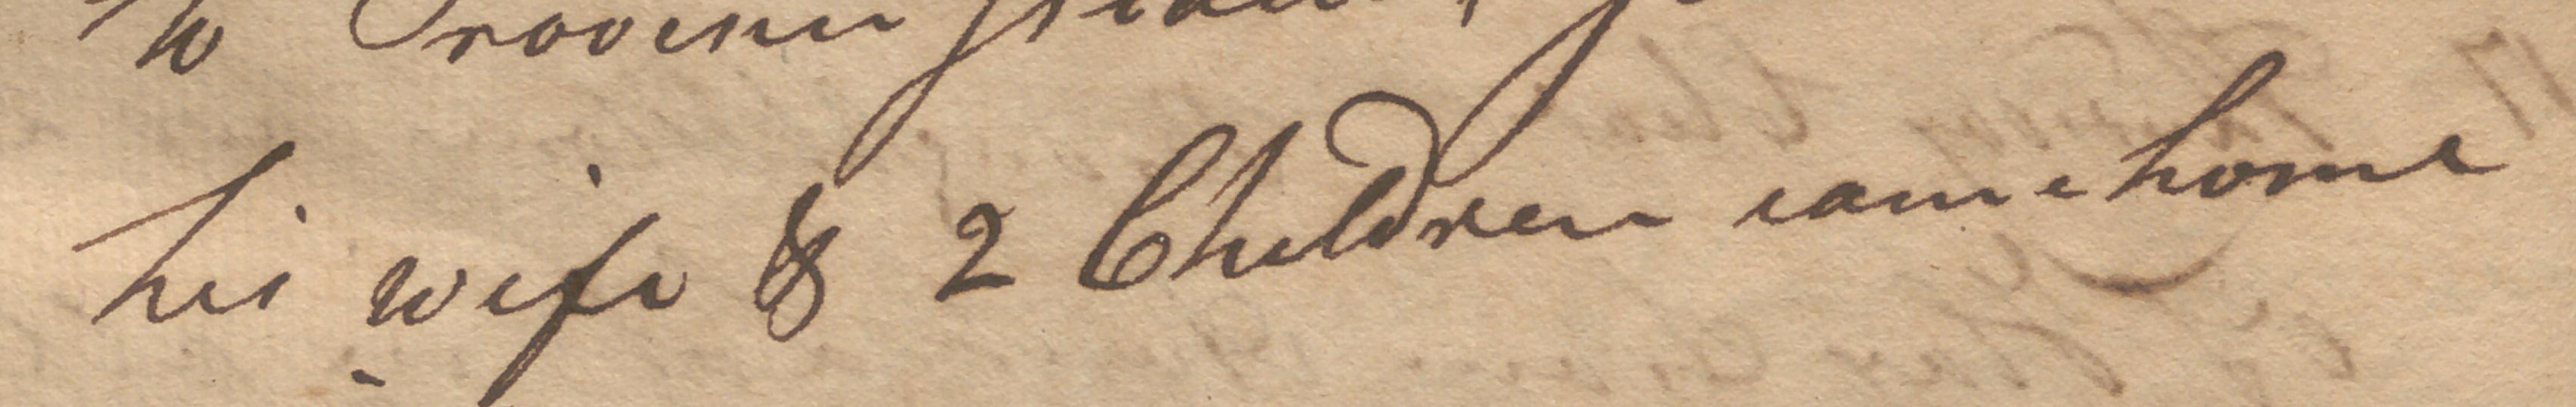his wife & 2 Children came home
